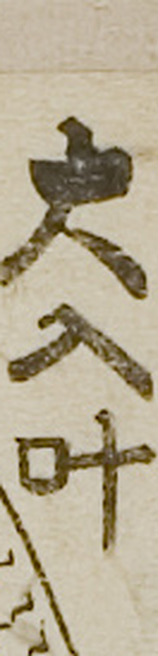大入叶
